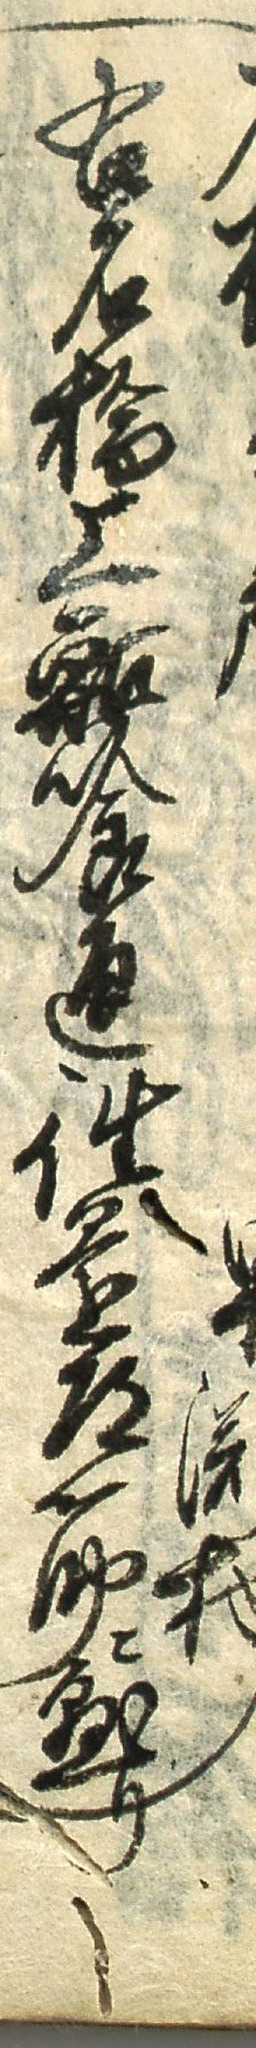右石橋上鮎喰通往還道筋ニ懸り
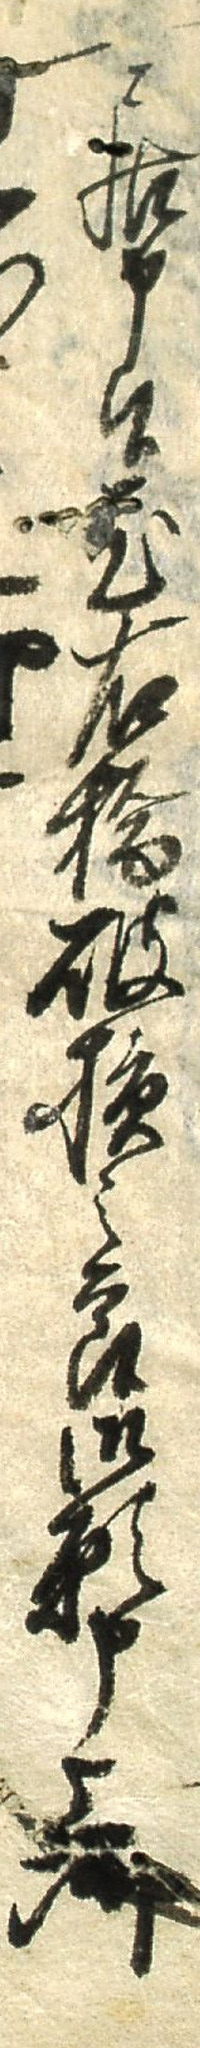居申候尤右橋破損之節御願申上御
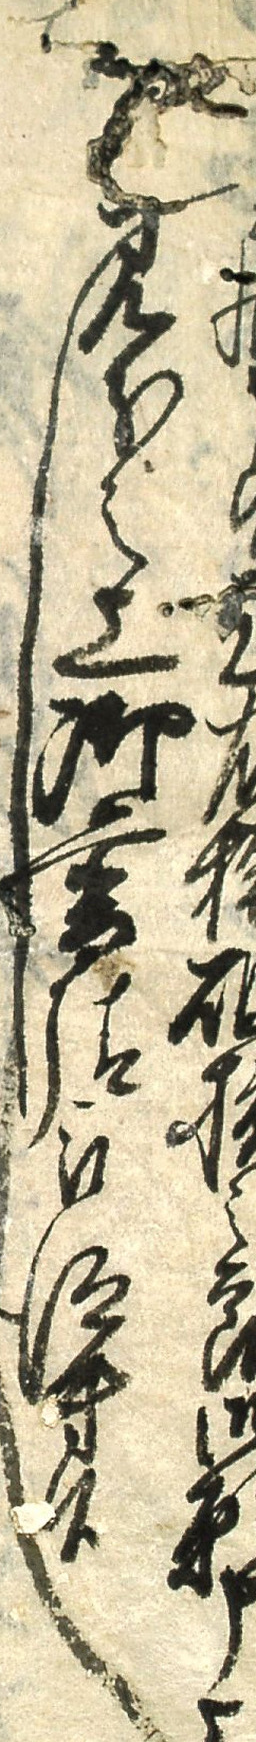見分之上御普請方被仰付候
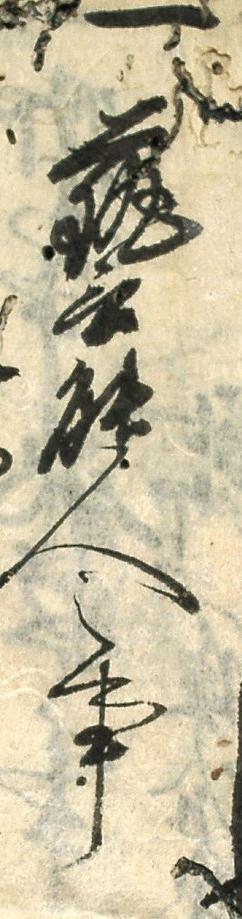一藝能人之事
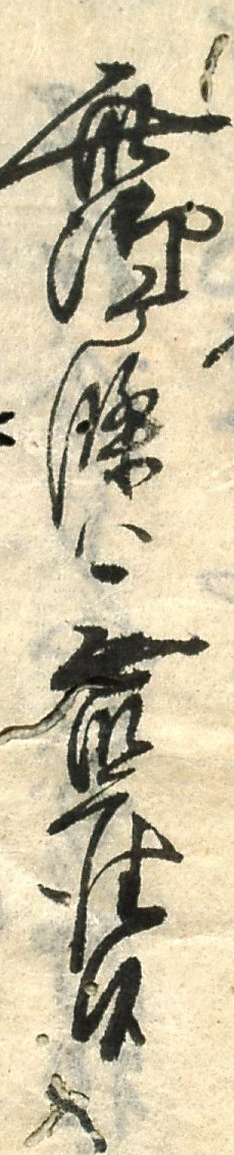此御ヶ條ハ無御座候
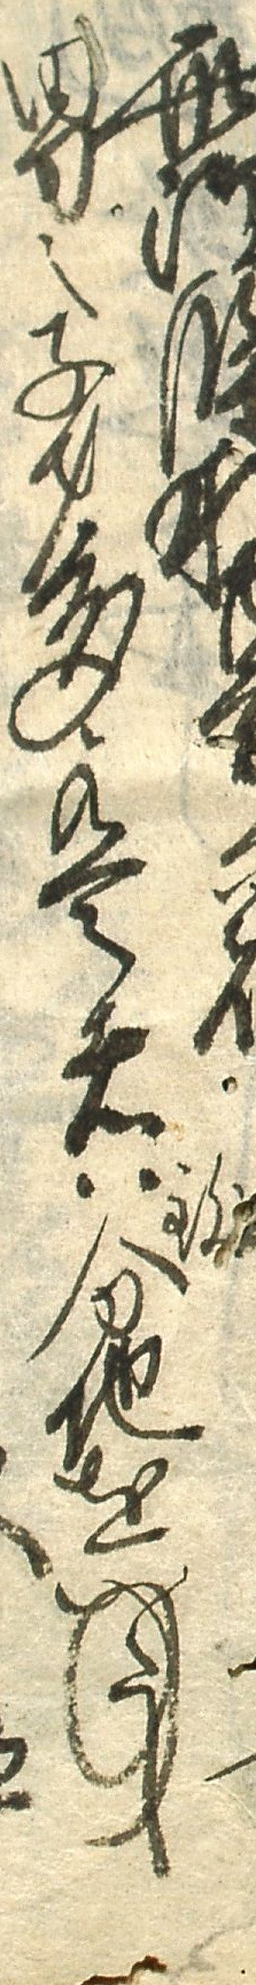男之子才多有之者ハ致分地をいたし
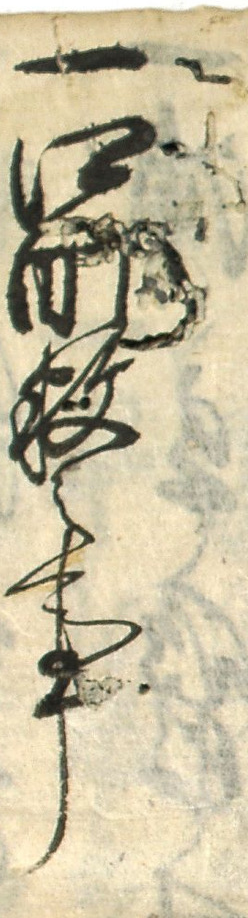一郷町数之事
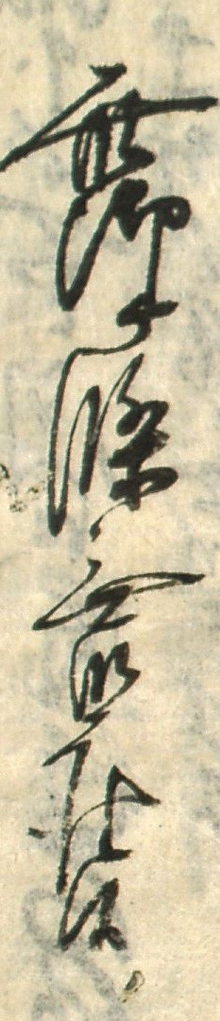此御ヶ條無御座候

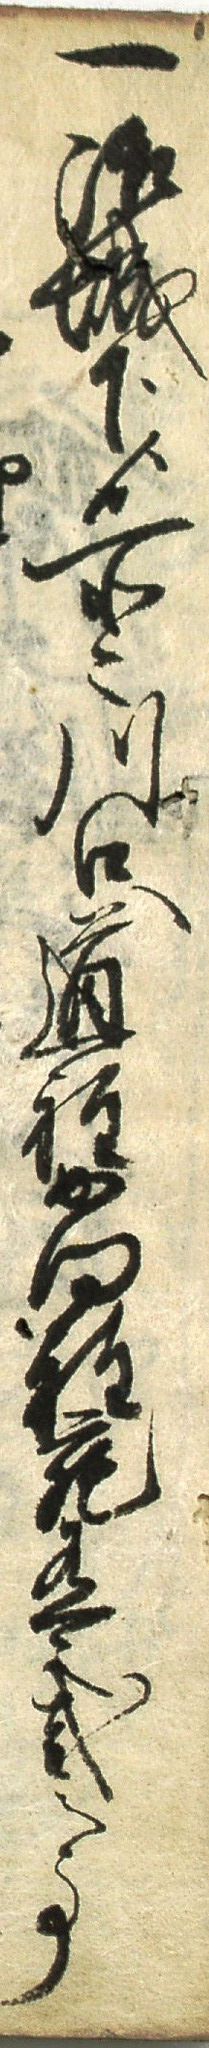一御城下ゟ所々川口へ道程如何程宛有之哉之事
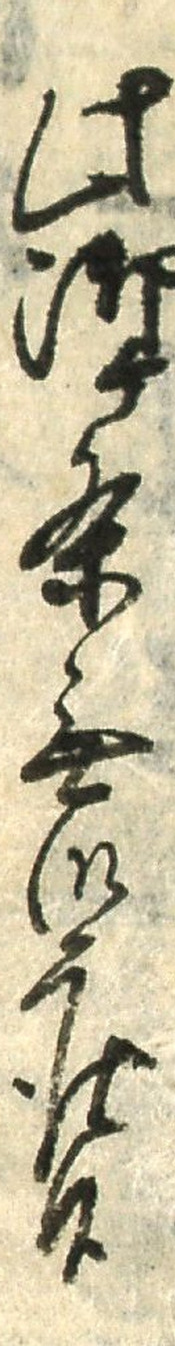此御ヶ条無御座候
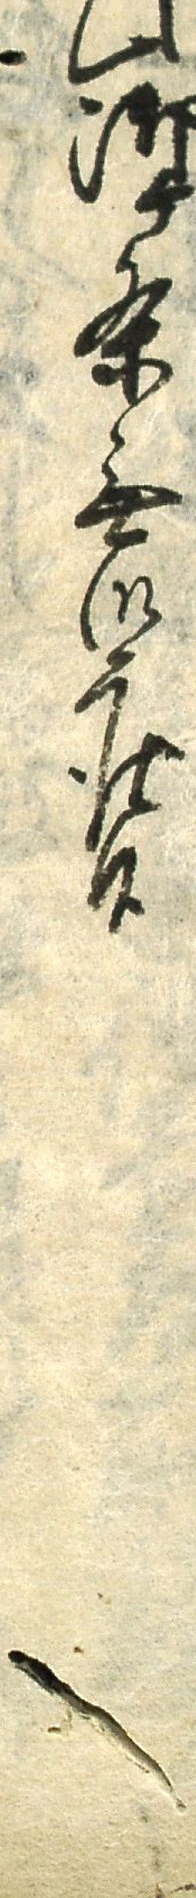此御ヶ条無御座候
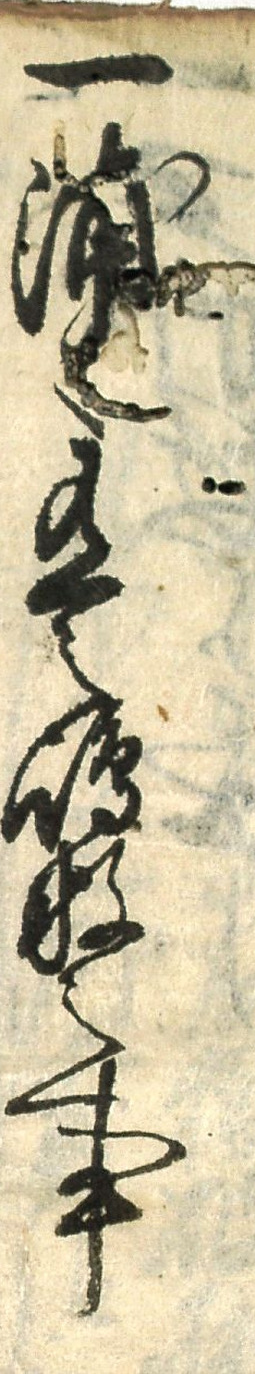一浦之有之嶋数之事
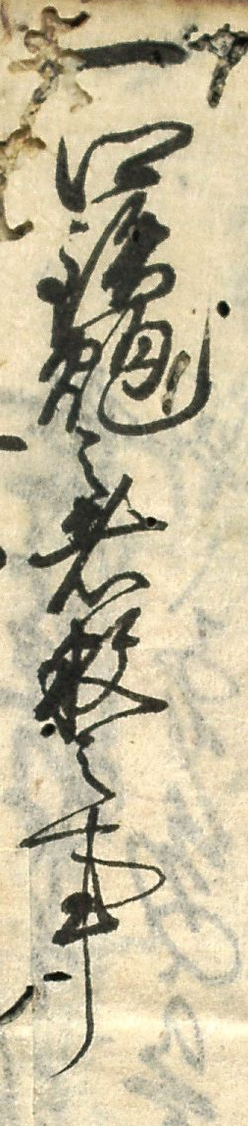一郷鉄炮之者数之事
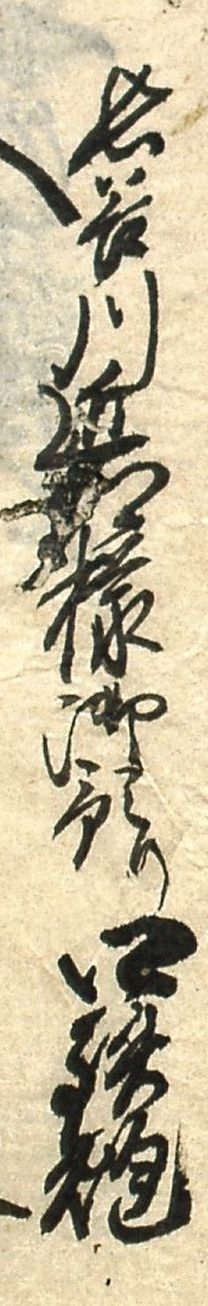長谷川近江様御預り郷鉄炮
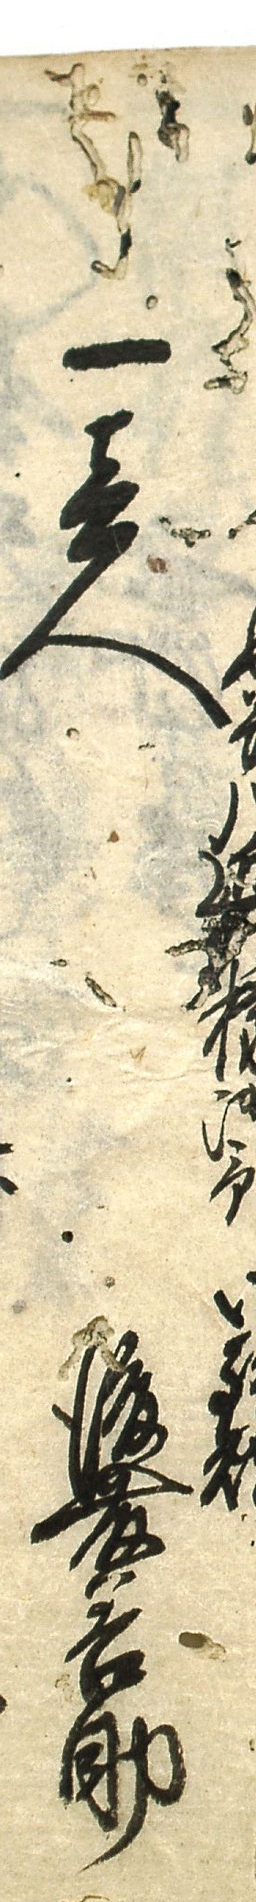一壱人後藤善助
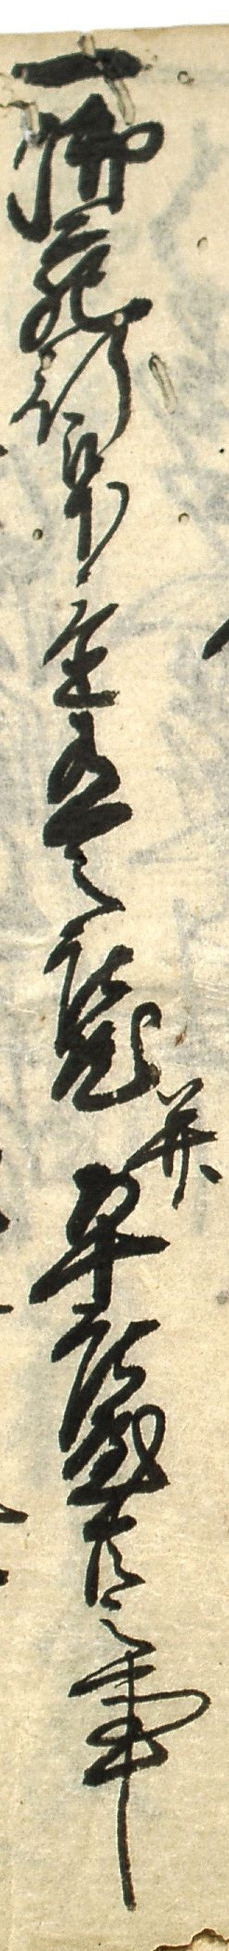一御宛行被下置有之庄屋幷平庄屋共之事
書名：御ヶ条ヲ以被仰附株々申上帳（早渕村控）
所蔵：鳴門教育大学 Naruto University of Education
